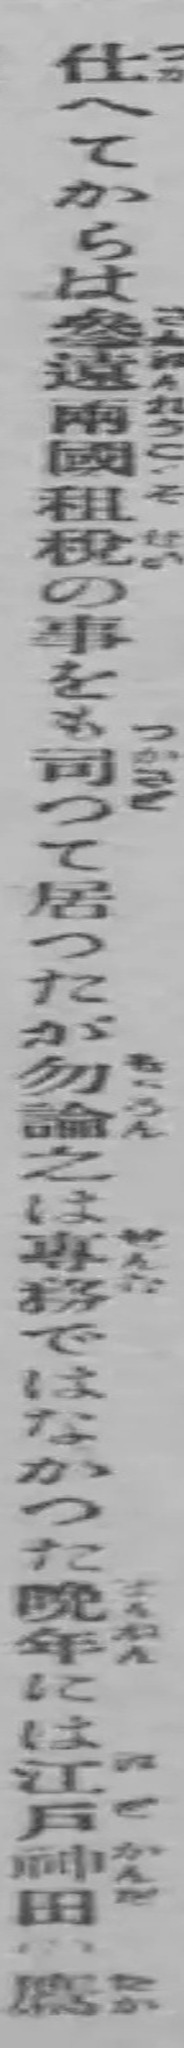仕へてからは参遠両国租税の事を司つて居たが勿論之は専務ではなかつた晩年には江戸神田の鷹
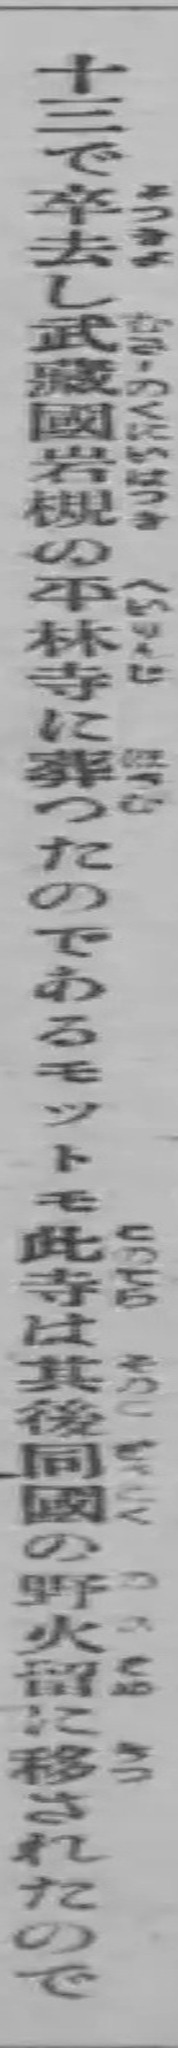平林寺十三で卒去し武蔵国岩槻の平林寺に葬つたのであるモツトモ此寺は其後同国の野火留に移されたので
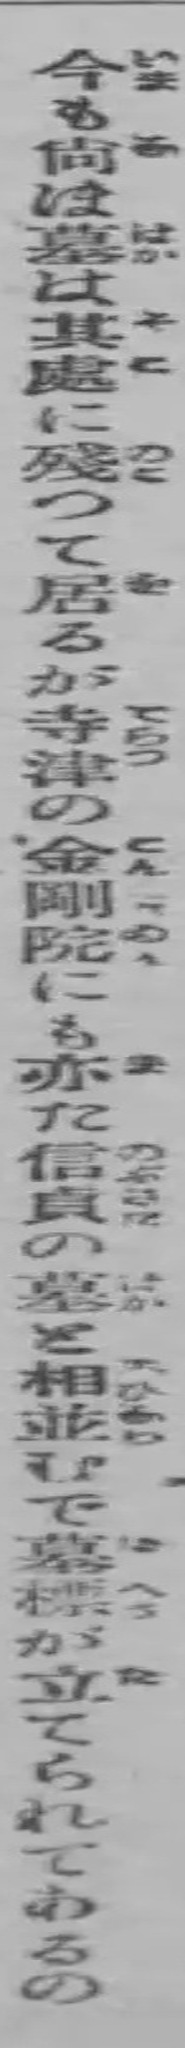今も尚ほ墓は其処に残つて居るが寺津の金剛院にも亦た信貞の墓と相並むで墓標が立てられてあるの
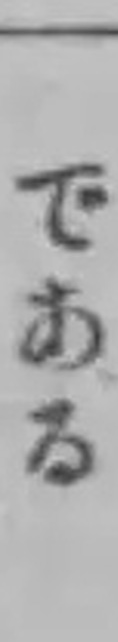である
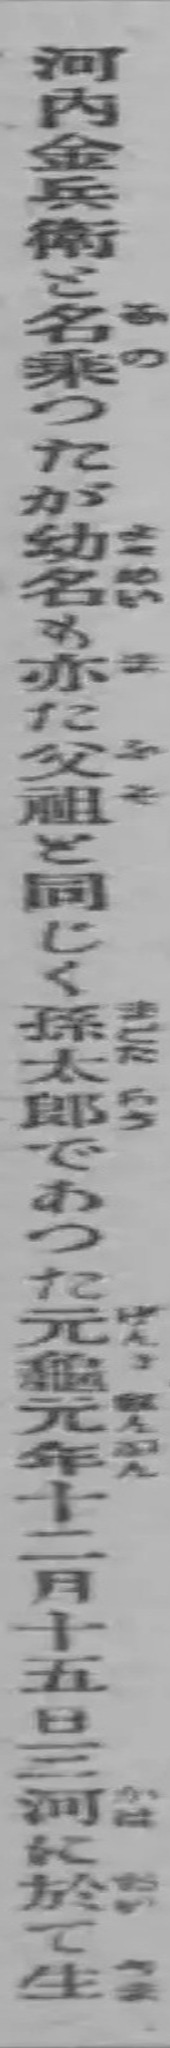大河内正綱河内金兵衛と名乗つたが幼名も亦た父祖と同じく孫太郎であつた元亀元年十二月十五日三河に於て生

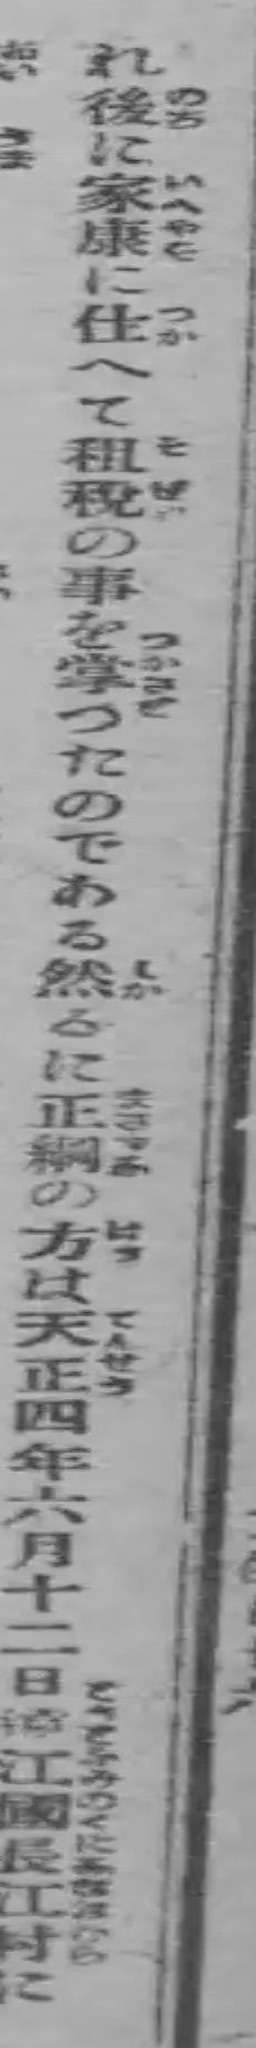れ後に家康に仕へて租税の事を掌つたのである然るに正綱の方は天正四年六月十二日遠江国長江村に
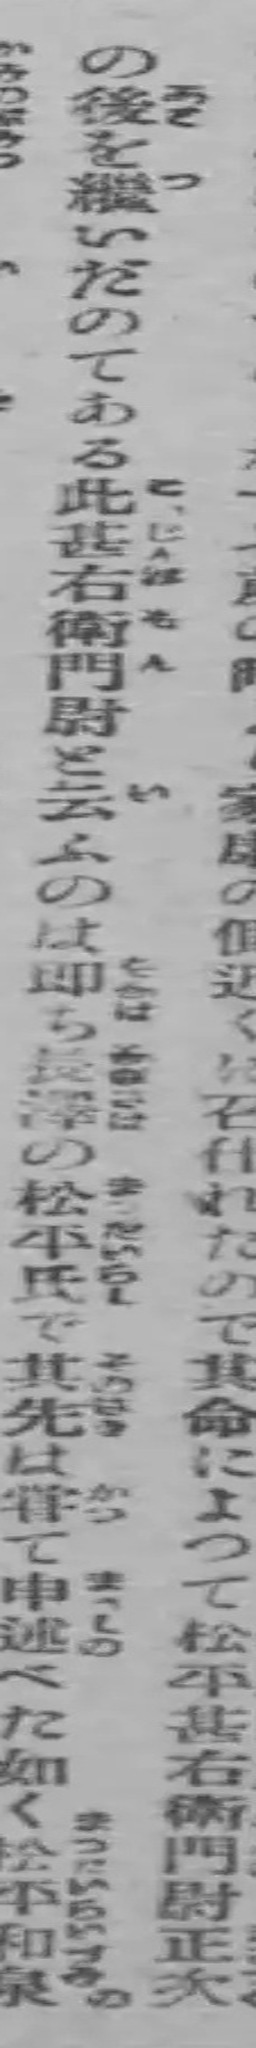の後を継いだのである此甚右衛門尉と云ふのは即ち長沢の松平氏で其先は嘗て申述べた如く松平和泉
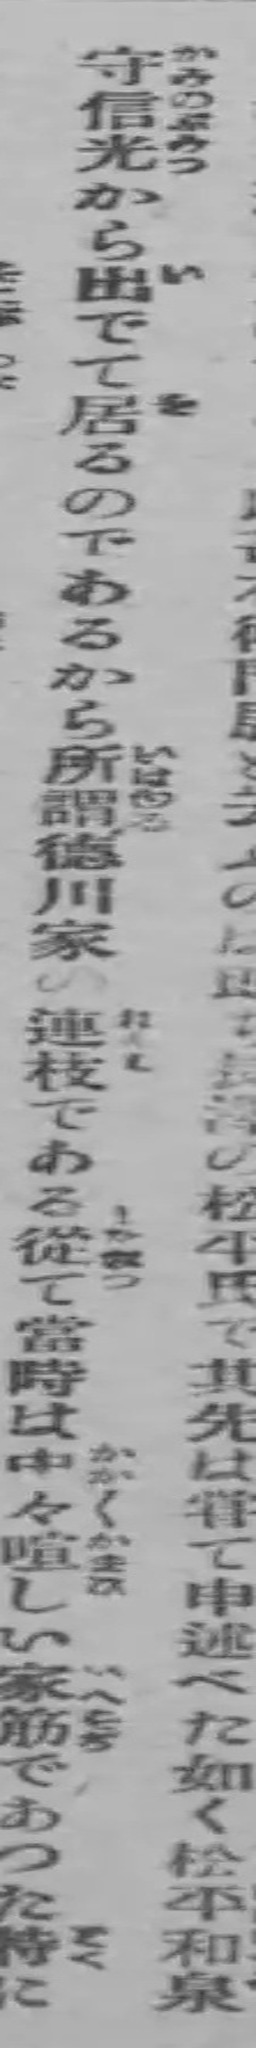守信光から出でて居るのであるから所謂徳川家の連枝である従て当時は中々喧しい家筋であつた特に
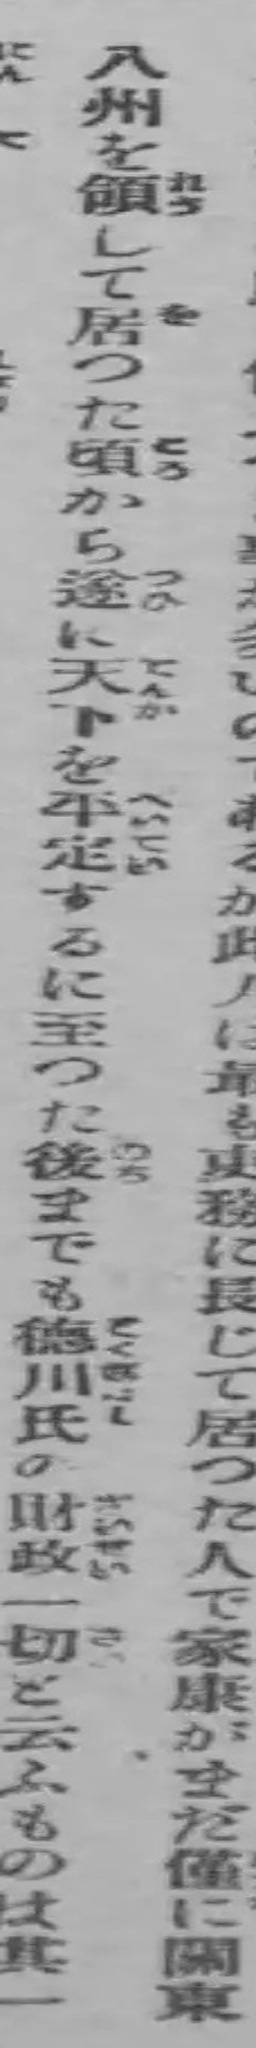八州を領して居つた頃から遂に天下を平定するに至つた後までも徳川氏の財政一切と云ふものは其一
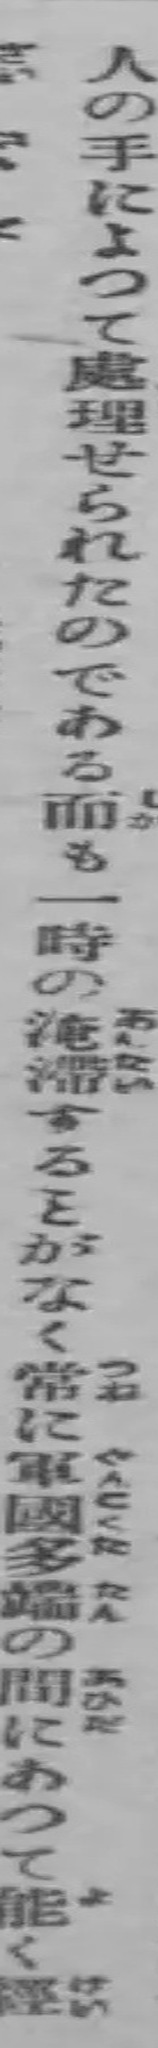人の手によつて処理せられたのである而も一時の淹滞することがなく常に軍国多端の間にあつて能く経
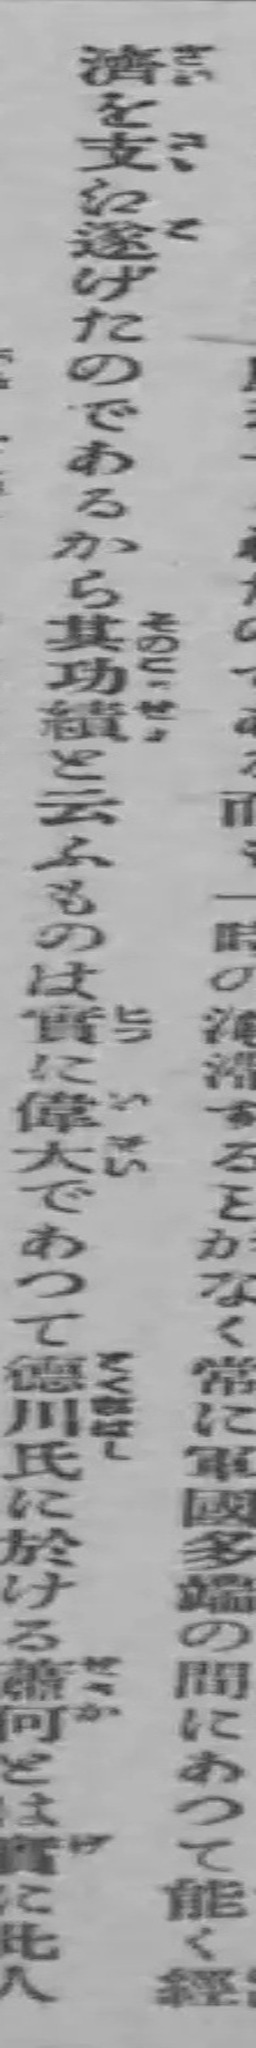済を支え遂げたのであるから其功績と云ふものは実に偉大であつて徳川氏に於ける蕭何とは実に此人
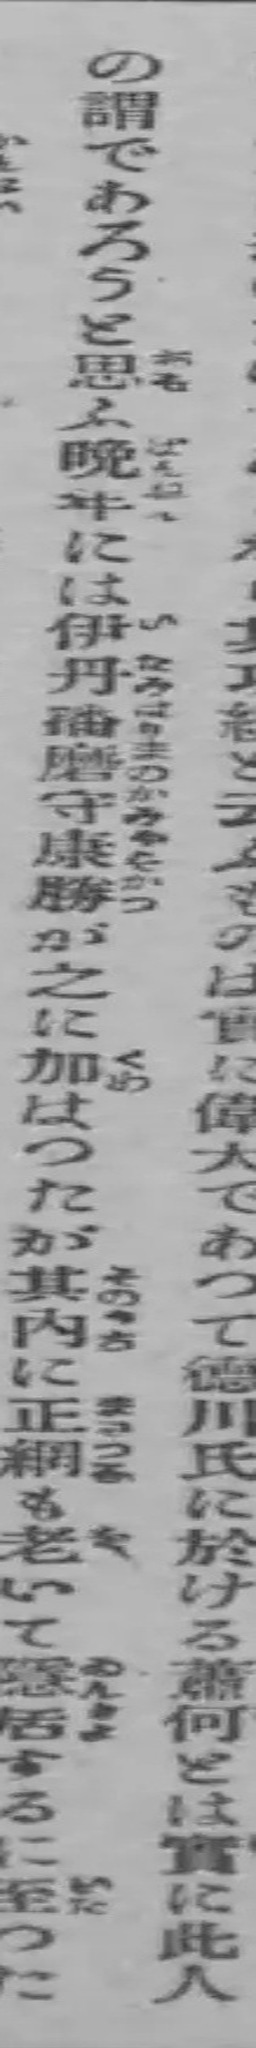の謂であろうと思ふ晩年には伊丹播磨守康勝が之に加はつたが其内に正綱も老いて隠居するに至つた
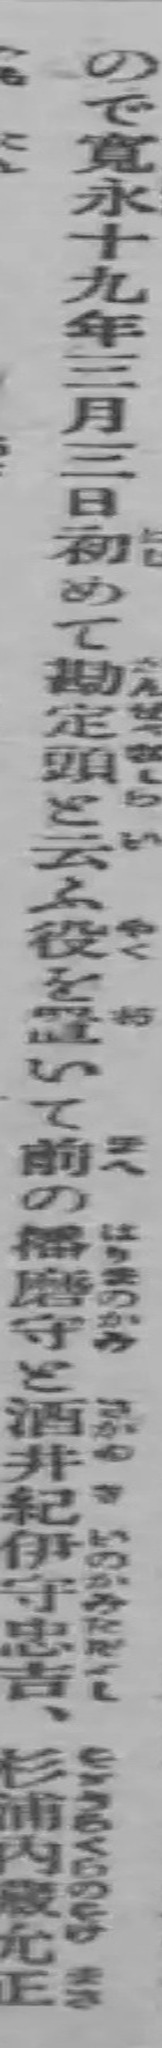ので寛永十九年三月三日初めて勘定頭と云ふ役を置いて前の播磨守と酒井紀伊守忠吉、杉浦内蔵允正綱
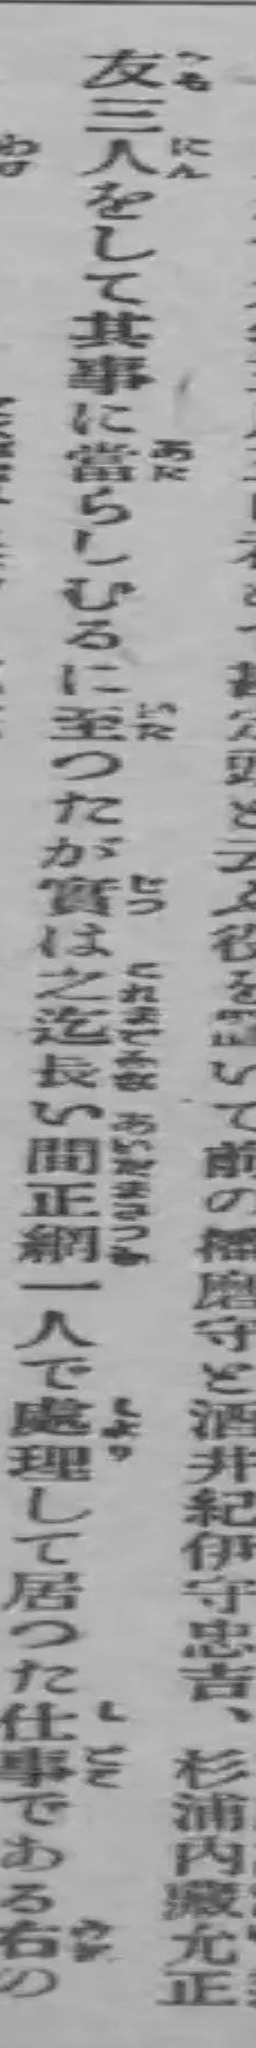友三人をして其事に当らしむるに至つたが実は之迄長い間正綱一人で処理して居つた仕事である右の
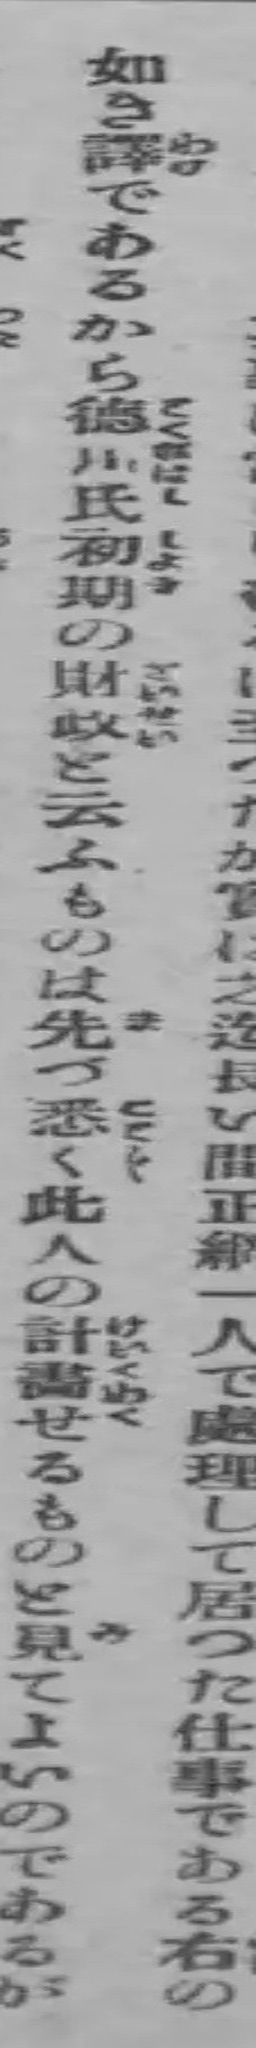如き訳であるから徳川氏初期の財政と云ふものは先づ悉く此人の計画せるものと見てよいのであるが
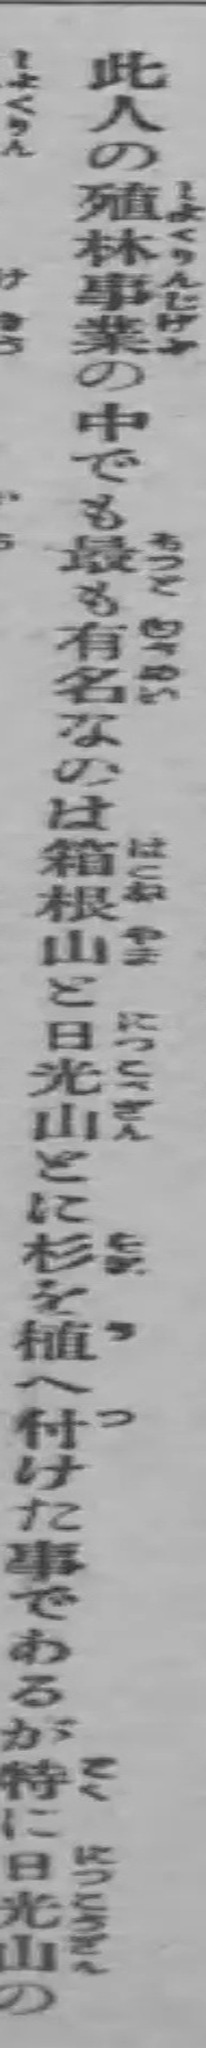此人の殖林事業の中でも最も有名なのは箱根山と日光山とに杉を植へ付けた事であるが特に日光山の
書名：豊橋市史談
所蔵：国立国会図書館 National Diet Library, JAPAN
